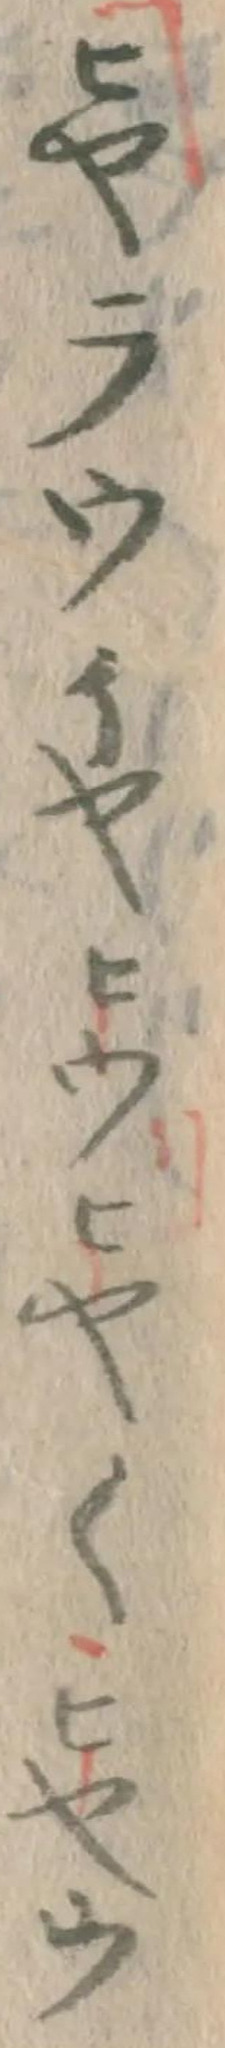〽ヒヤラウイヤヒ-ウヒ-ヤ〳〵ヽヒ-ヤウ
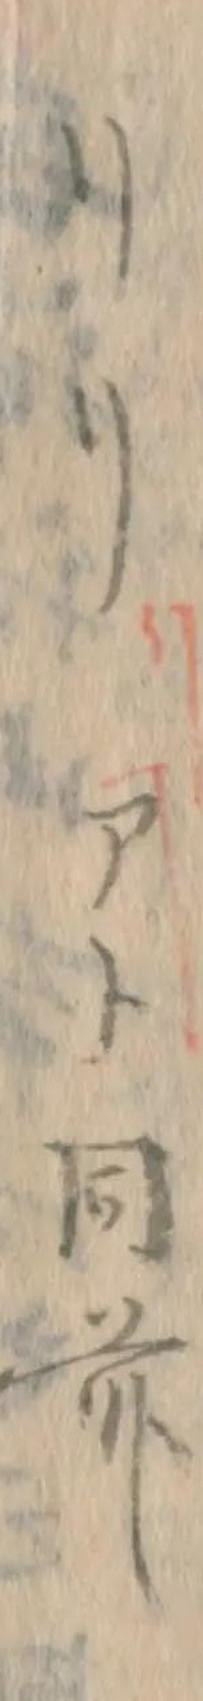リリ〽アト同前
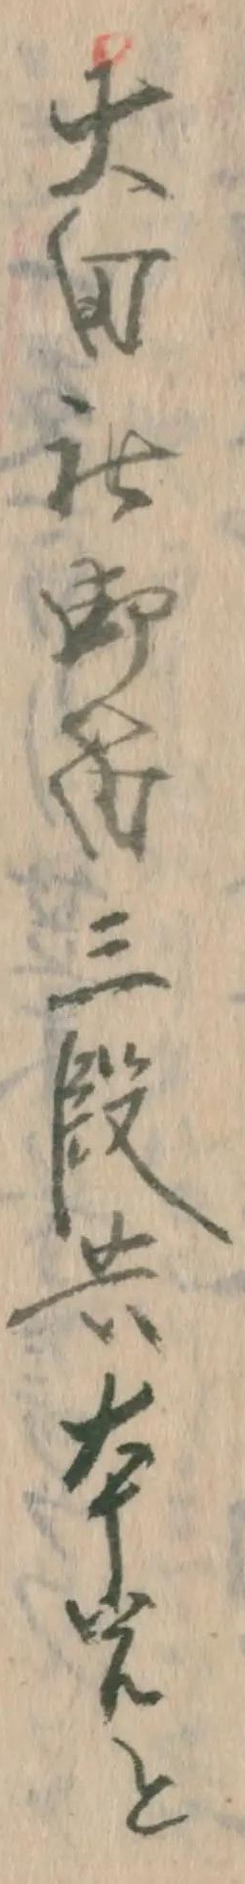◦大田社御笛三段共本宮と
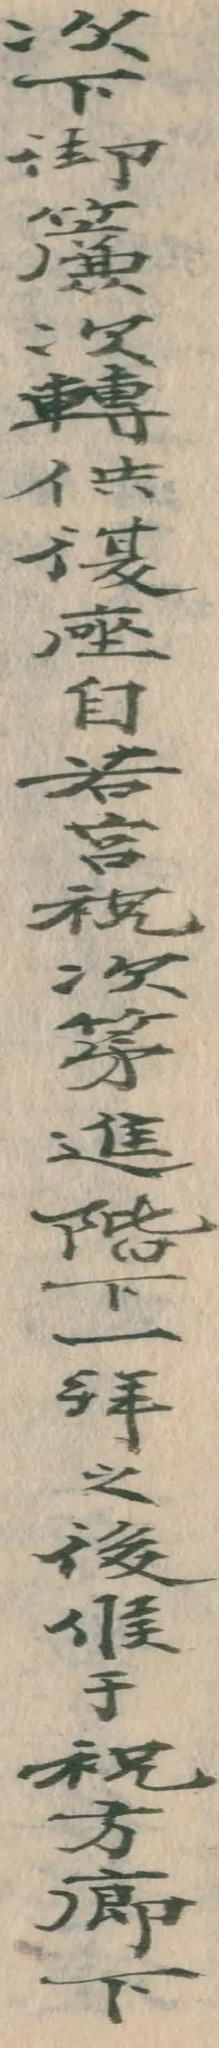次下御簾次転供復座自若宮祝次第進階下一拝之後候于祝方廊下
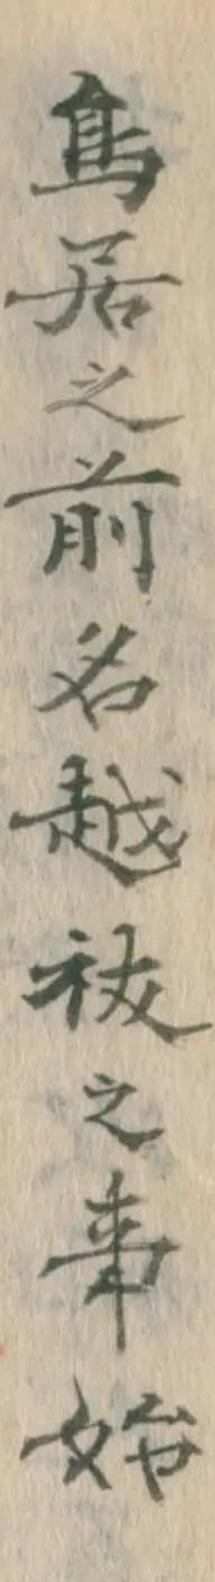鳥居之前名越祓之事始

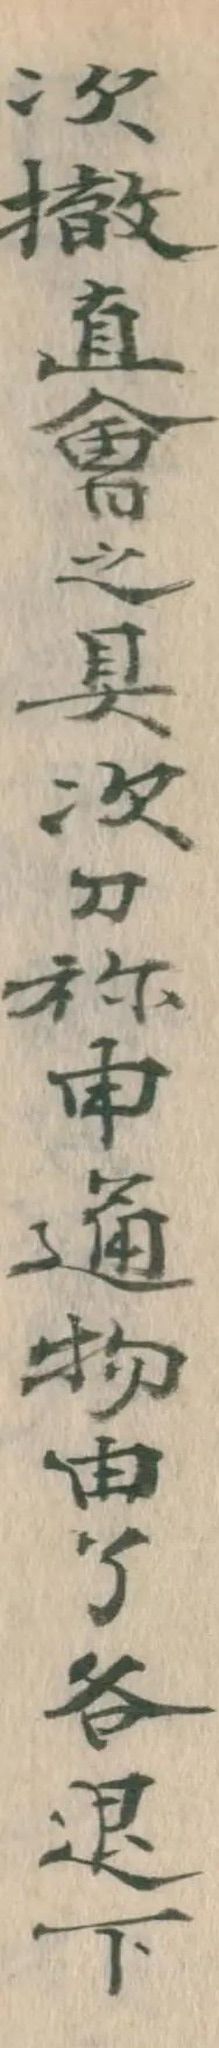次撤直会之具次刀祢申通物由了各退下

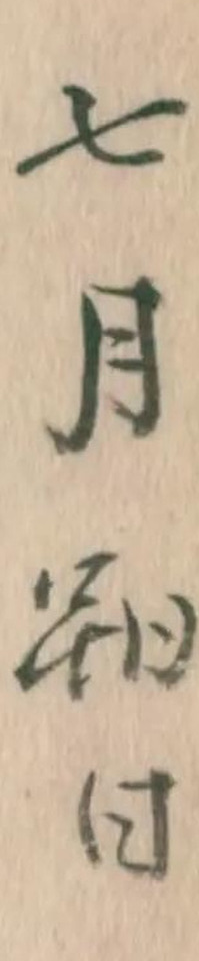七月朔日
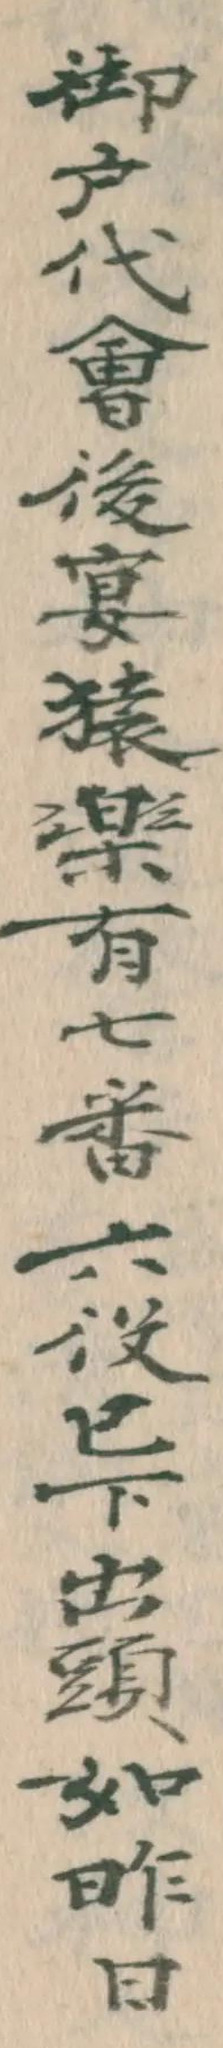御戸代会後宴猿楽有七番六役已下出頭如昨日
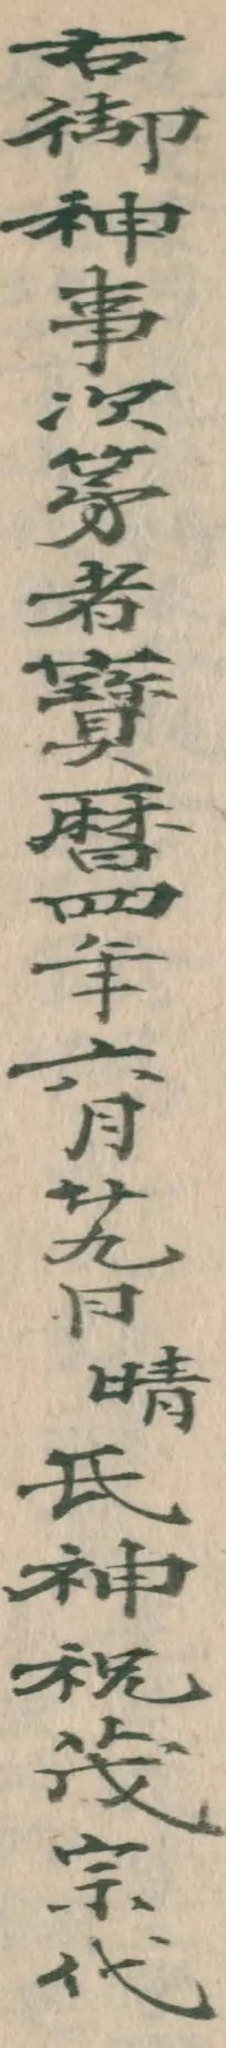右御神事次第者宝暦四年六月廿九日晴氏神祝茂宗代
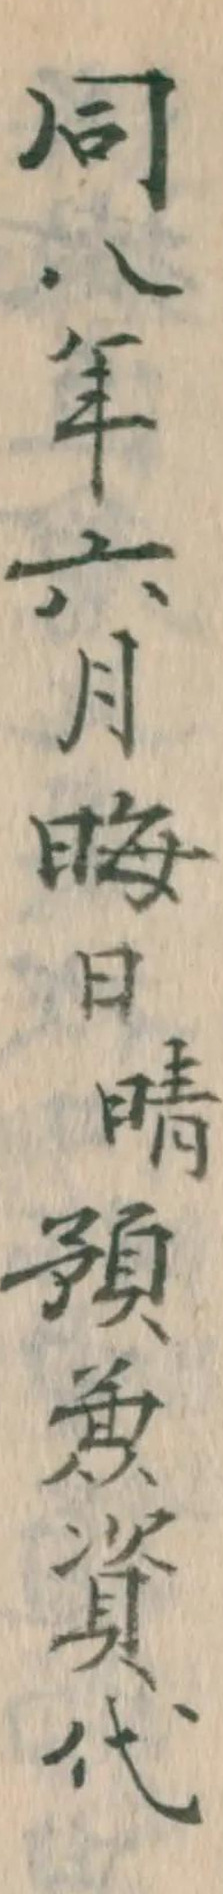同八年六月晦日晴預兼資代
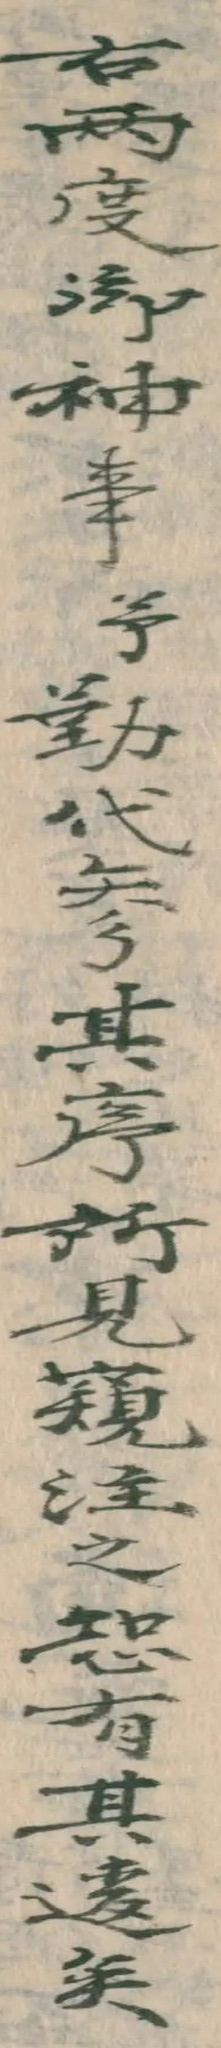右両度御神事予勤代参其序所見窺注之恐有其違矣
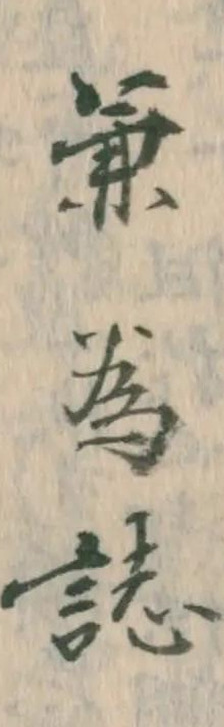兼為誌
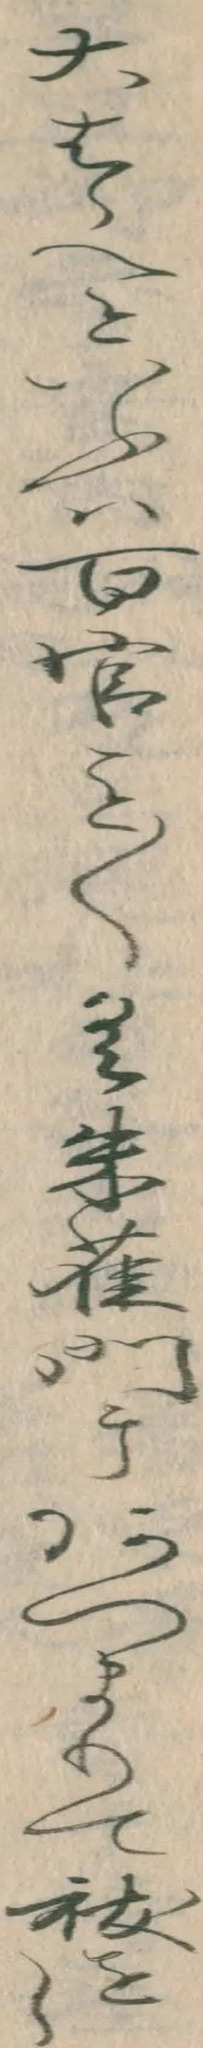大はらへといふは百官こと〳〵く朱雀門にあつまりて祓をし
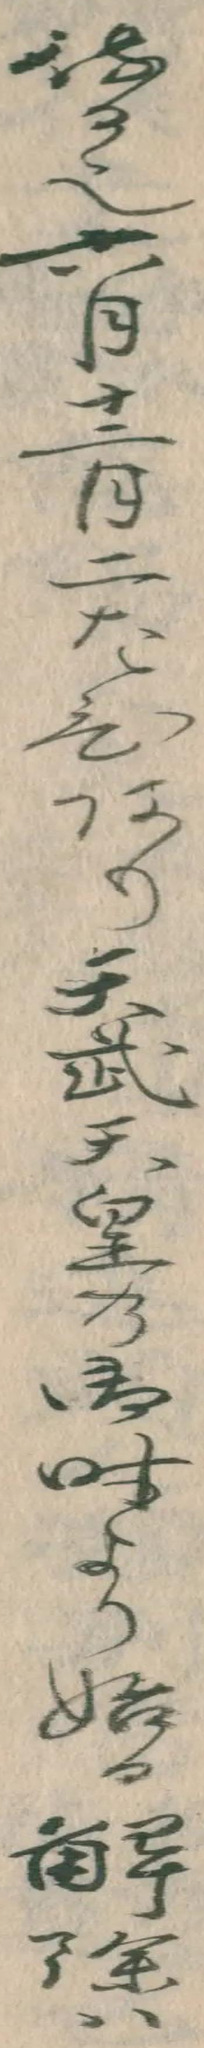待る也六月十二月二たひあり天武天皇の御時より始る解除は
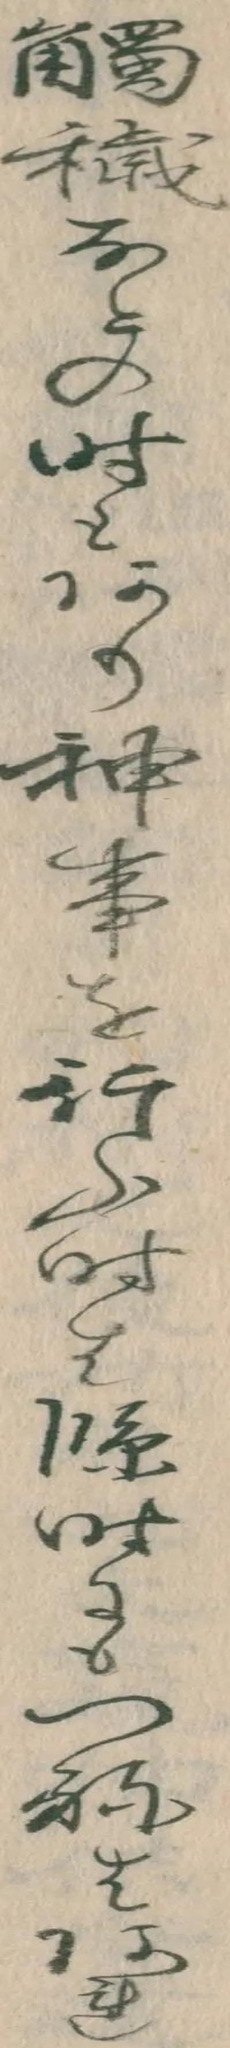触穢なとの時もあり神事を行ふ時は臨時にもつねはあれ
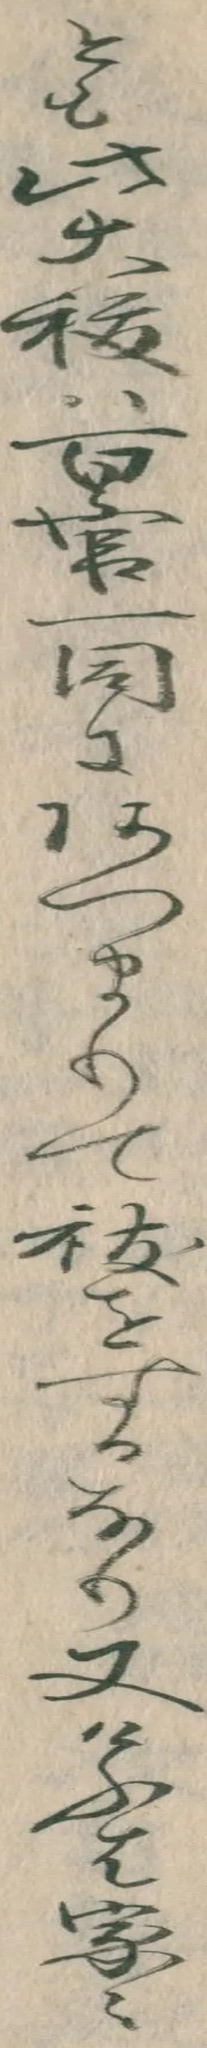とも此大祓は百官一同にあつまりて祓をするなり又けふは家々
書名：賀茂社記録. 第9冊
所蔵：国立国会図書館 National Diet Library, JAPAN
